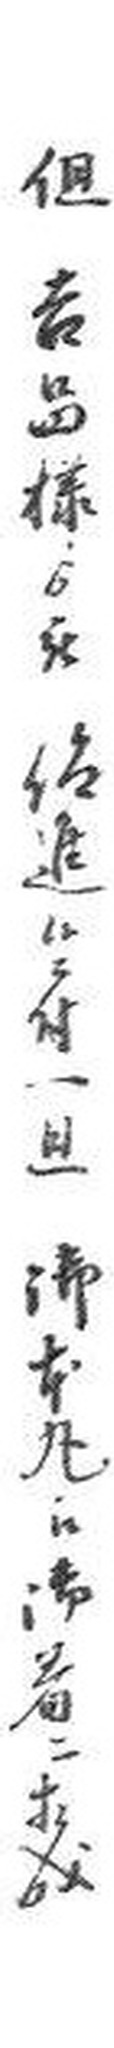但吉品様ゟ被仰進候ニ付一旦御本丸江御着ニ相成
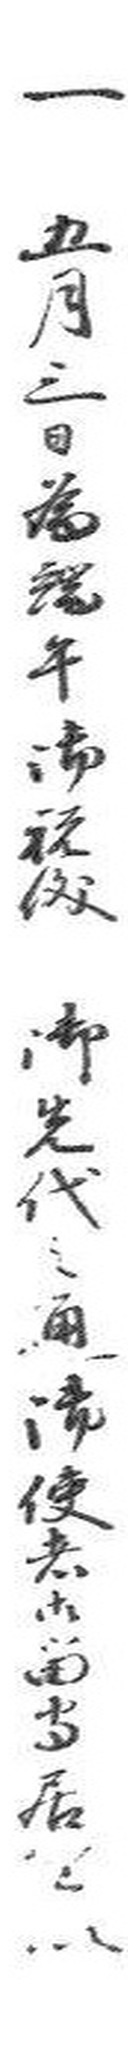一五月三日為端午御祝儀御先代之通御使者御留守居を以
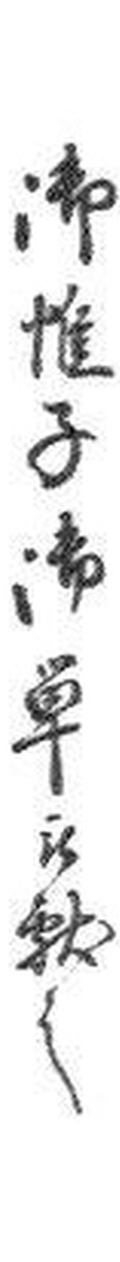御帷子御単被献之
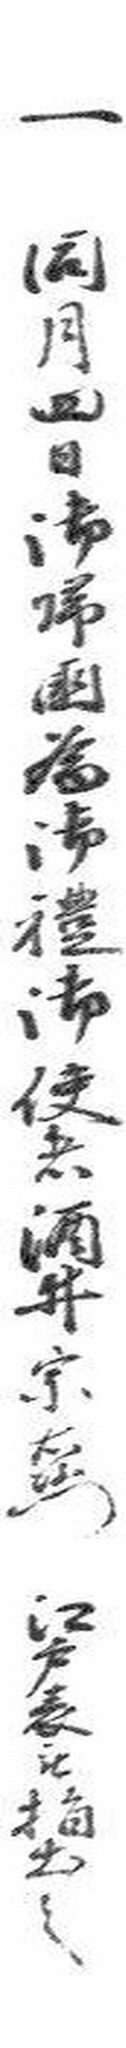一同月四日御帰国為御礼御使者酒井宗右衛門江戸表被指出之
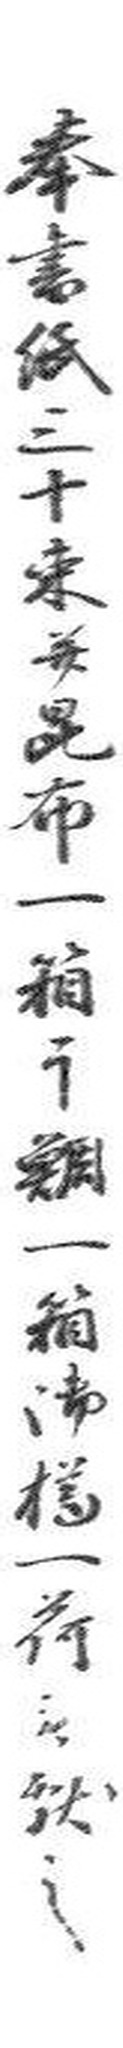奉書紙三十束并昆布一箱干鯛一箱御樽一荷被献之
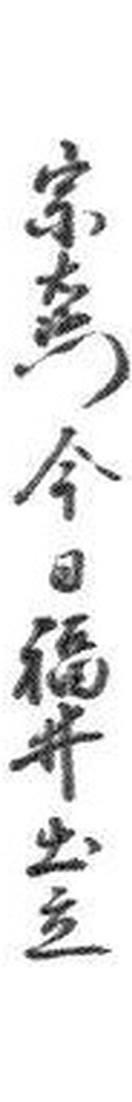宗右衛門今日福井出立
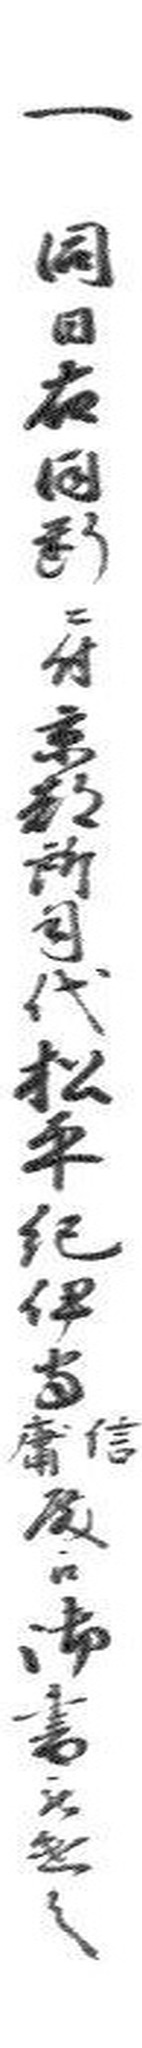一同日右同断ニ付京都所司代松平紀伊守信庸殿江御書被遣之
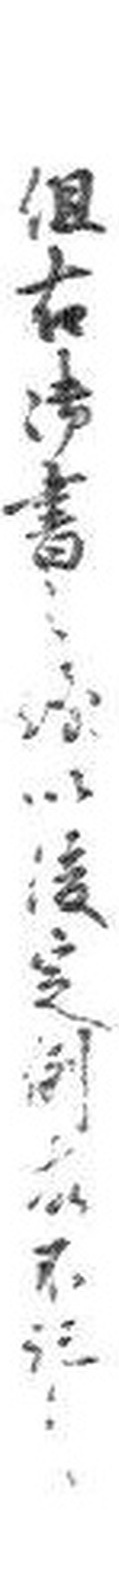但右御書之儀以後定例故不記之
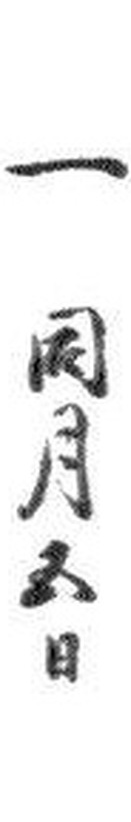一同月五日
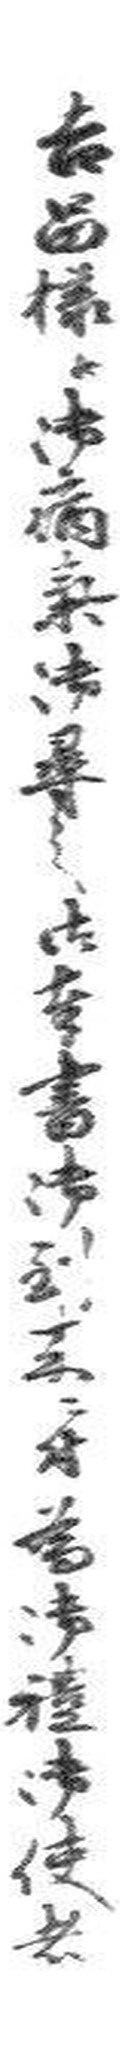吉品様御江御病気御尋之御奉書御到来ニ付為御礼御使者
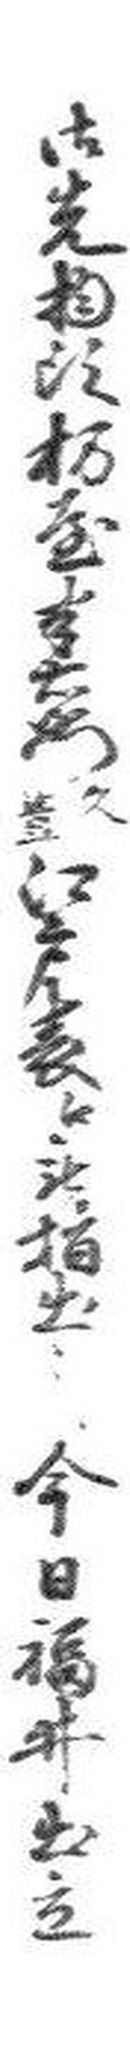御先物頭栃屋半右衛門久豊江戸表江被指出之今日福井出立
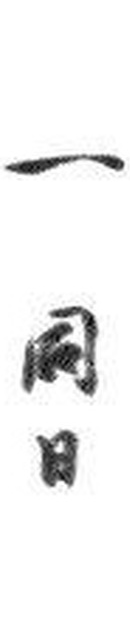一同日
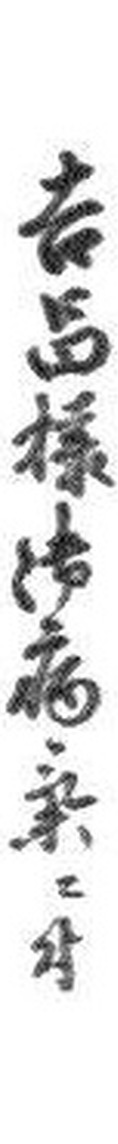吉品様御病気二付
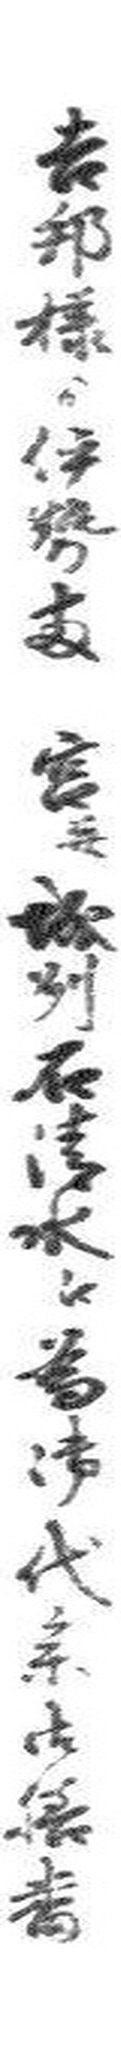吉邦様ゟ伊勢両宮并城州石清水江為御代参御膳番
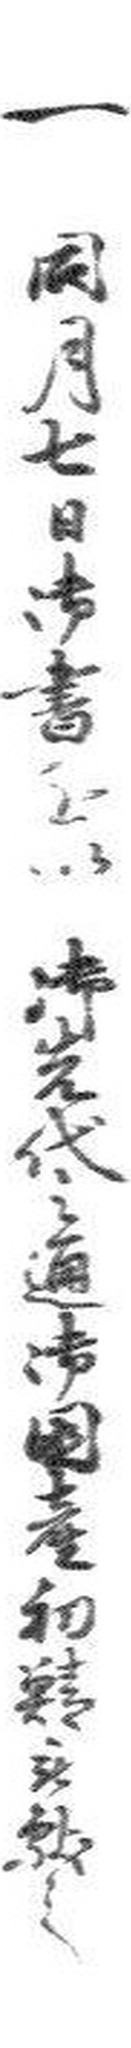一同月七日御書を以御先代之通御国産初鯖被献之

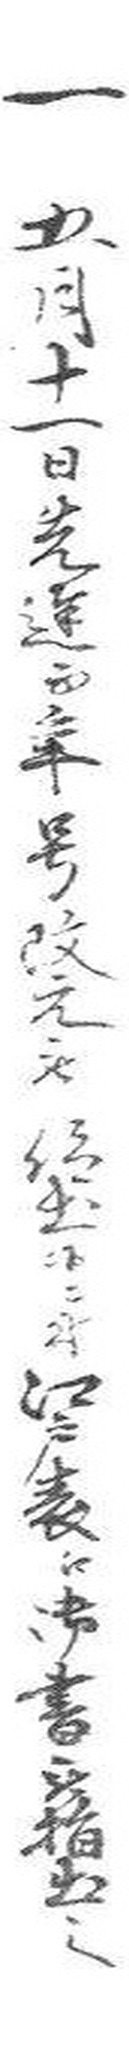一五月十一日先達而年号改元被仰出候ニ付江戸表江御書被指出之
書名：家譜 二十八 吉邦公 従宝永七年七月五日到正徳元年十二月
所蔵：福井県文書館 Fukui Prefectural Archives
